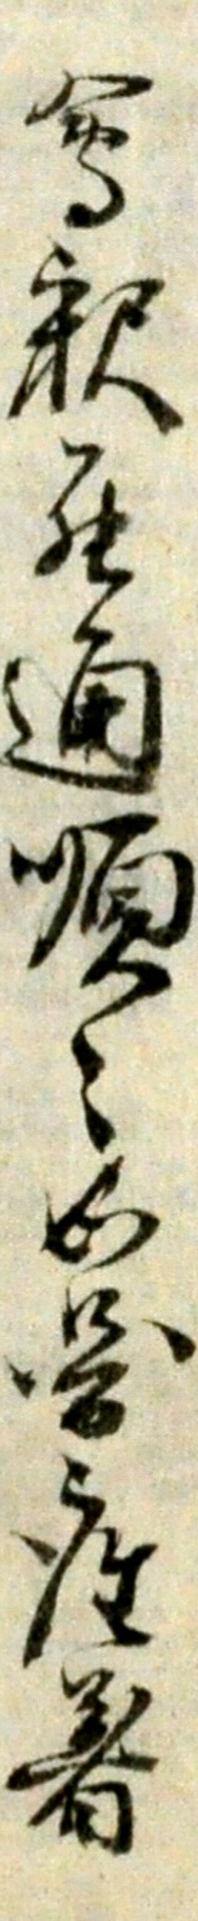会釈罷通順々如図座着
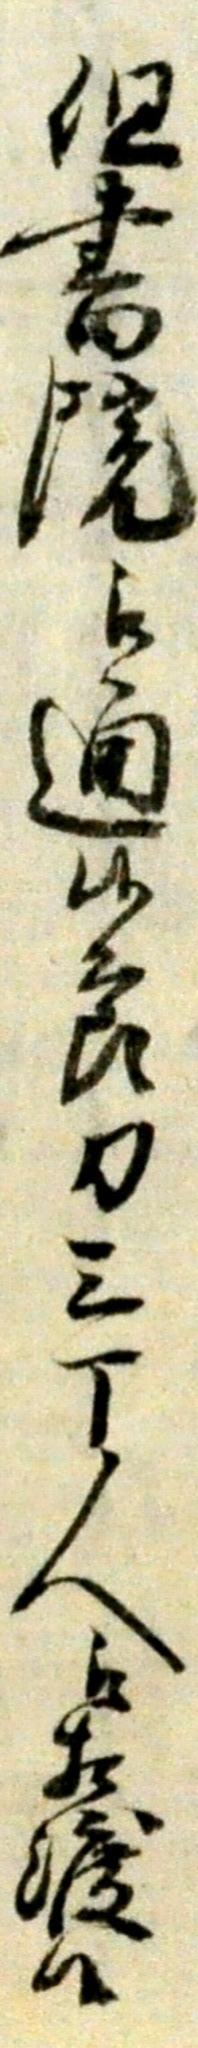但書院江通候節三町人江相渡候

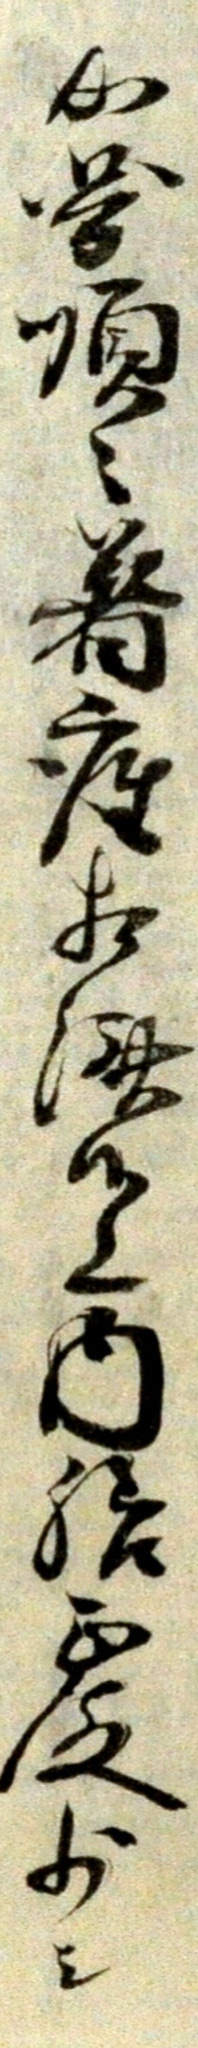如図順々着座相済候上内膳正殿少シ
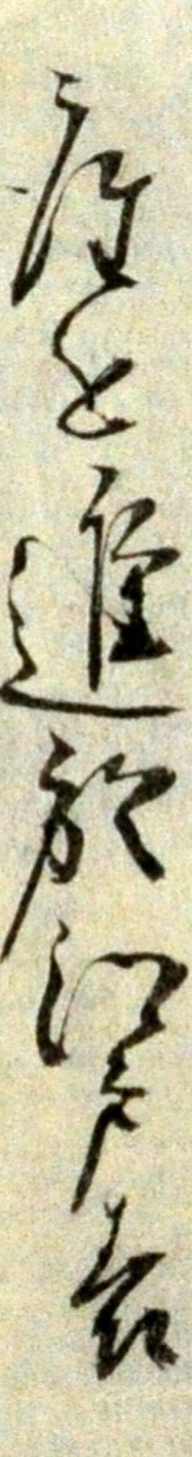座を進於江戸表
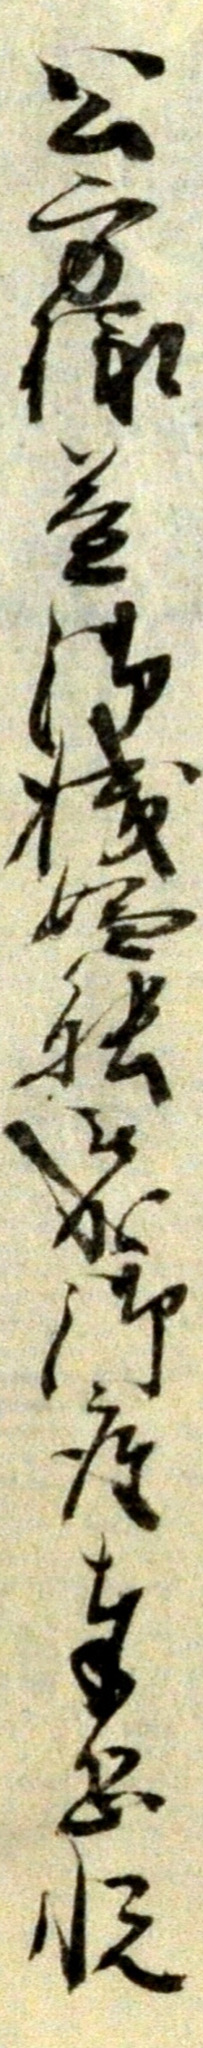公方様益御機嫌能被成御座奉恐悦
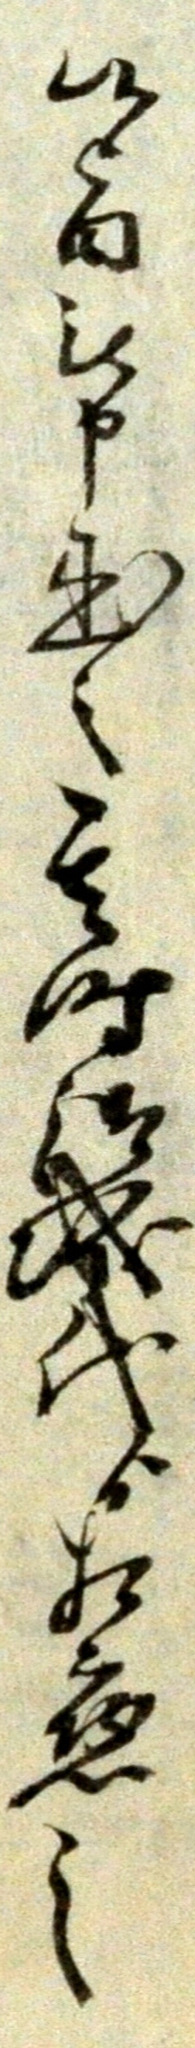候旨被申述之其時御城代ゟ相応之
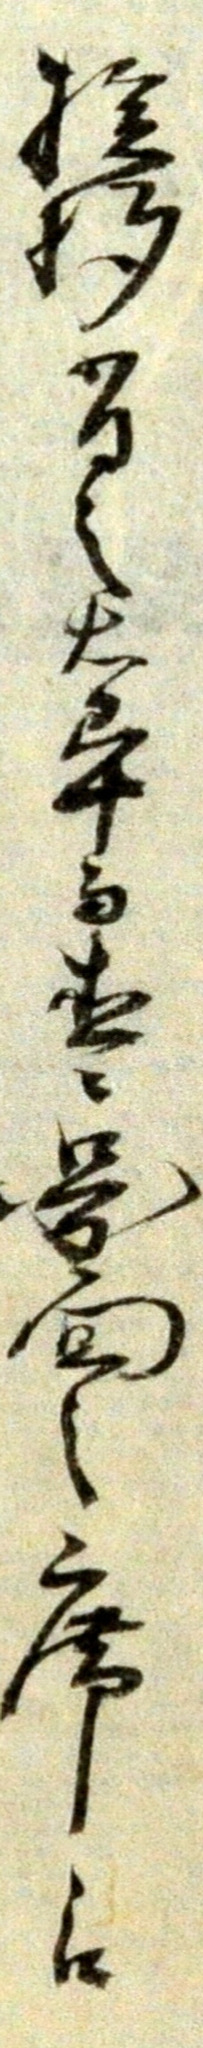挨拶有之右卆而直二図面之席江
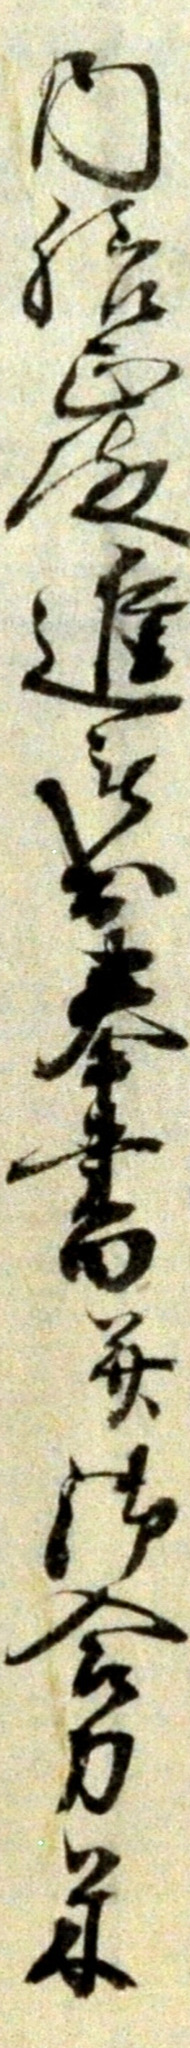内膳正殿進被出奉書幷御合力米
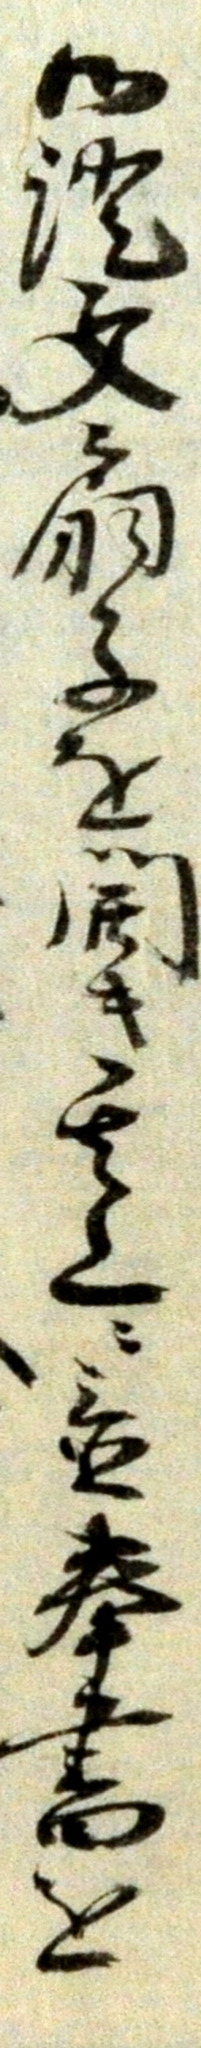御證文扇子を開キ其上ニ置奉書を

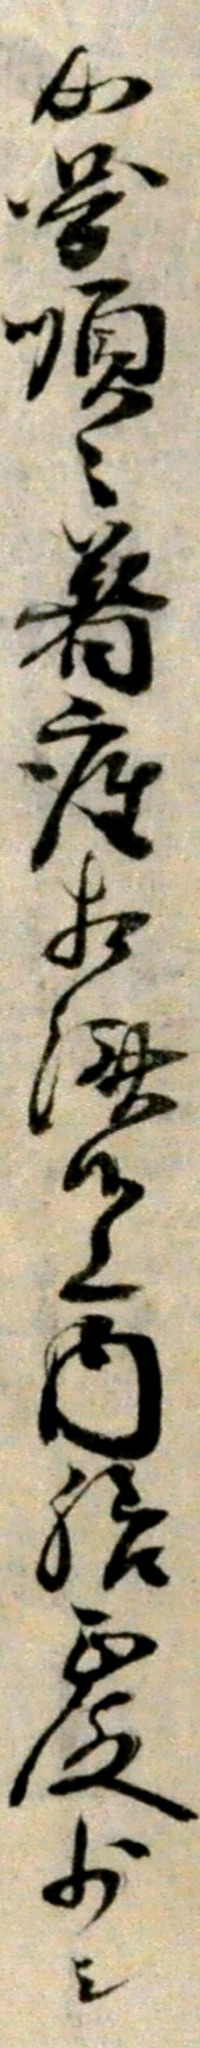如図順々着座相候上内膳正殿少シ
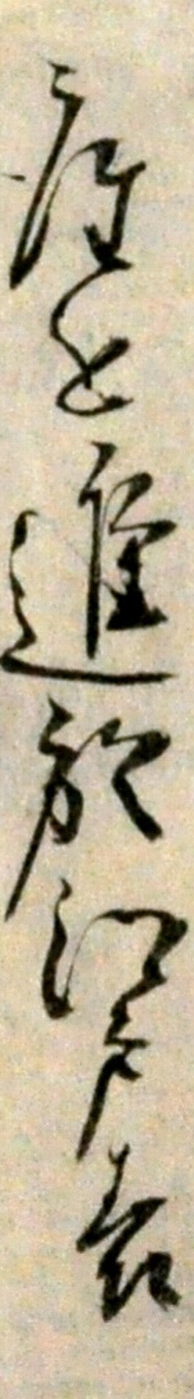座を進於江戸表
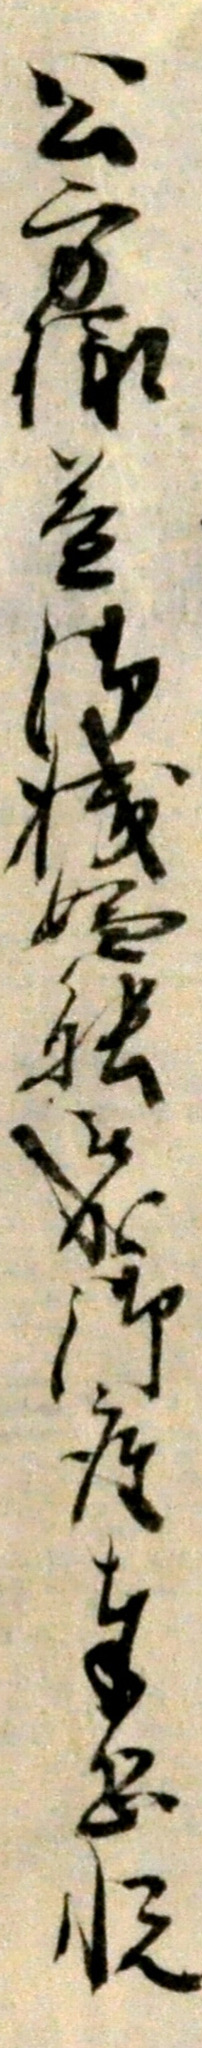公方様益御機嫌能被成御座奉恐悦
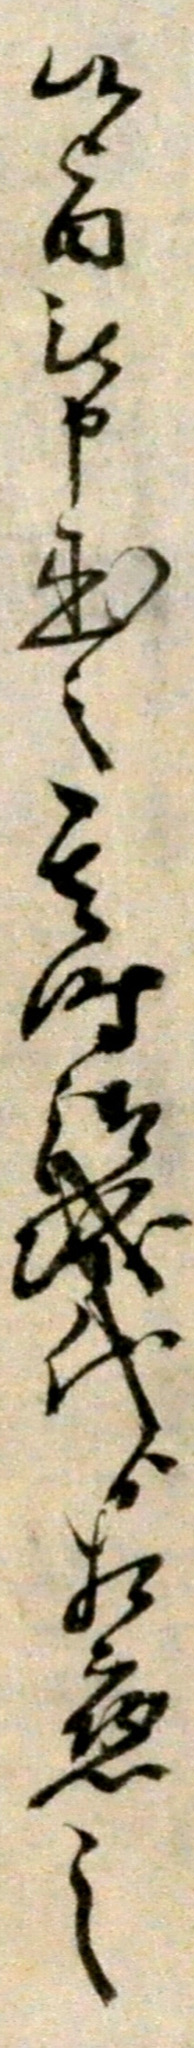候旨被申出之其時御城代ゟ相応之
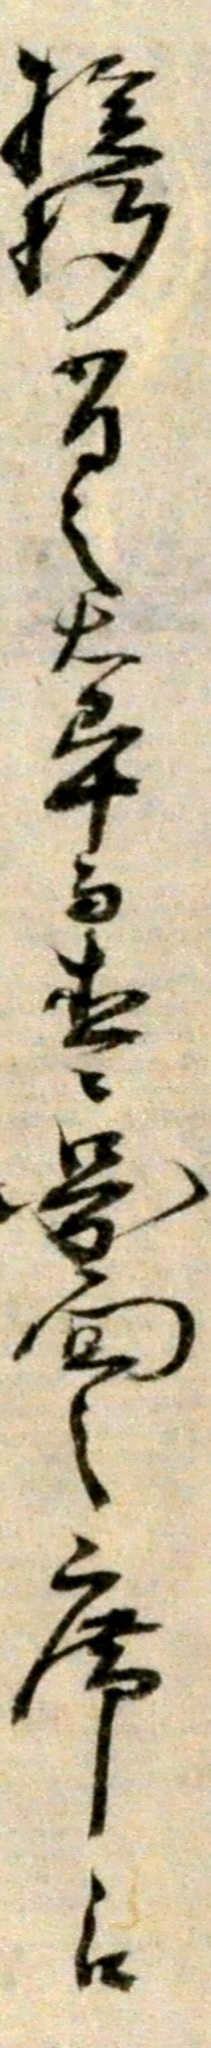挨拶有之右卆而直ニ図面之席江
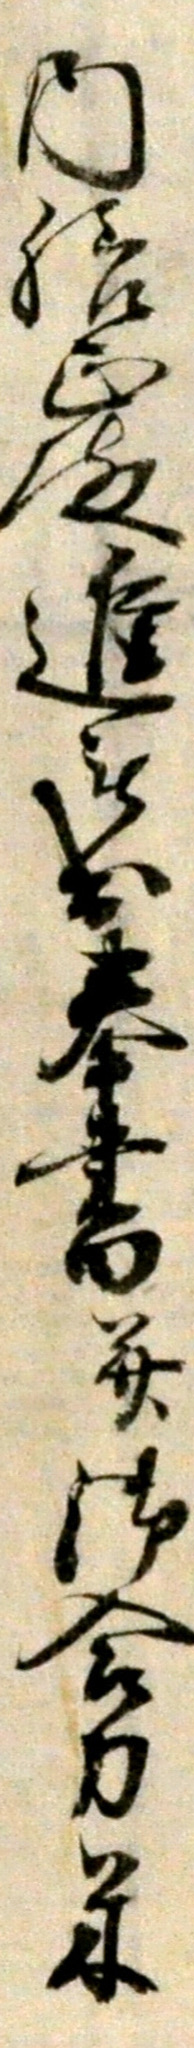内膳正殿進被出奉書幷御合力米
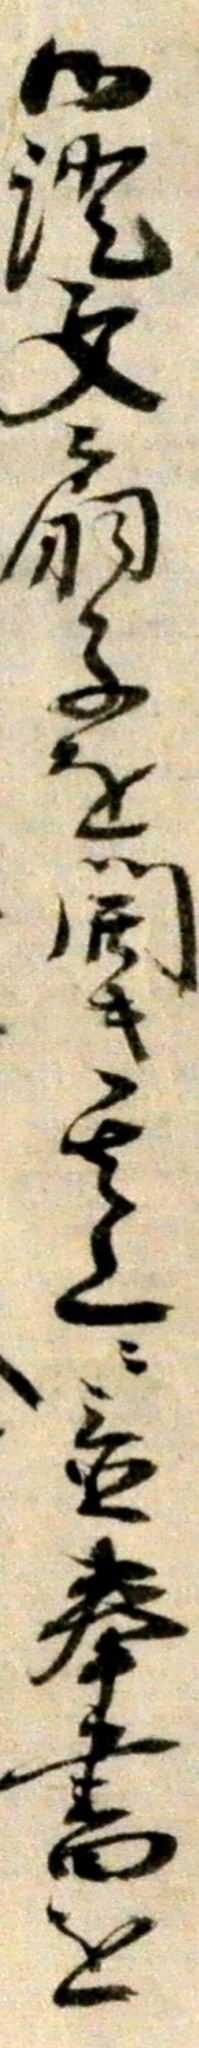御證文扇子を開キ其上二置奉書を
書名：大阪加番関係諸書留〔一括〕
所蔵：伊那市立高遠町図書館・合同会社AMANE
